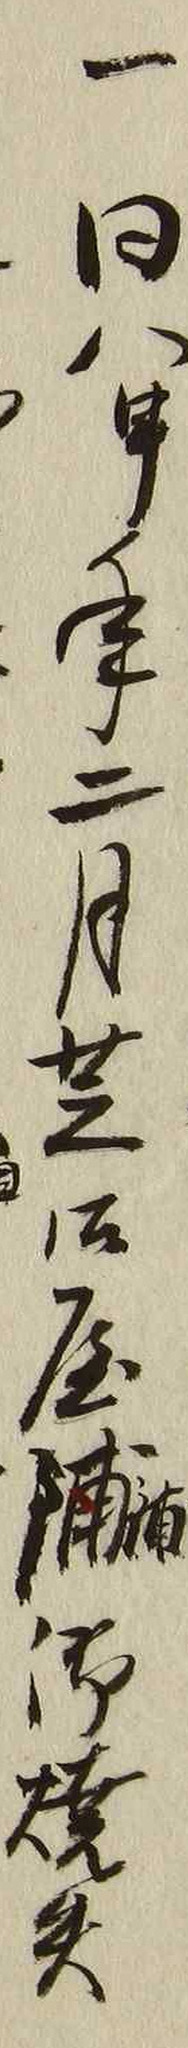一同八申年二月芝御屋鋪御焼失
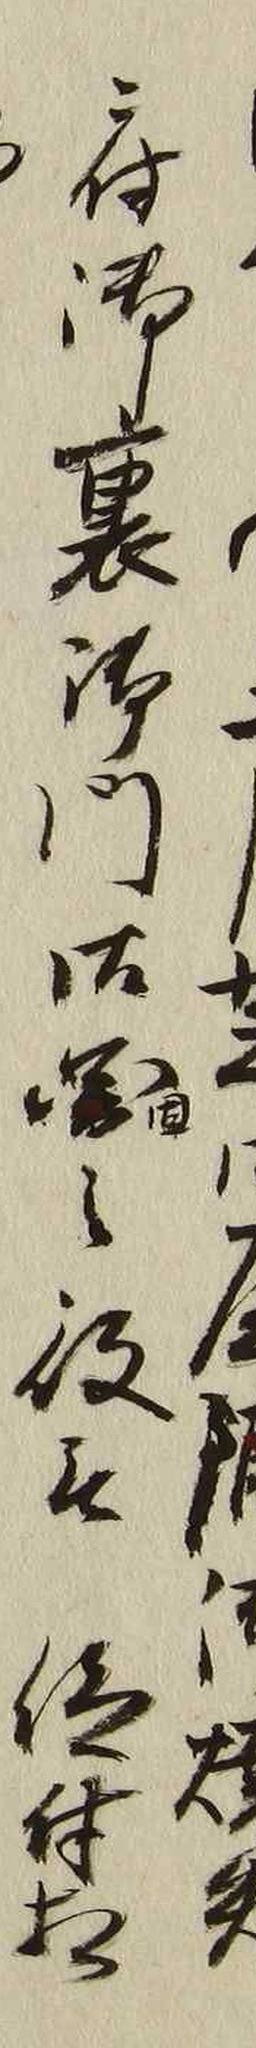ニ付御裏御門御固之役被仰付相
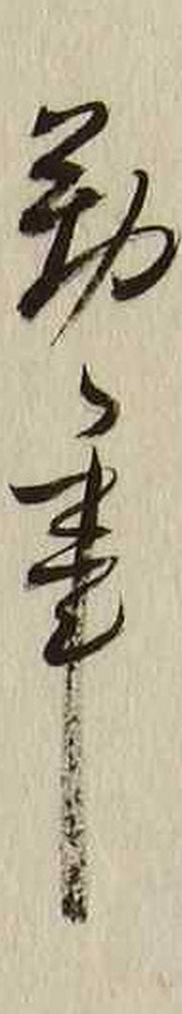勤候事
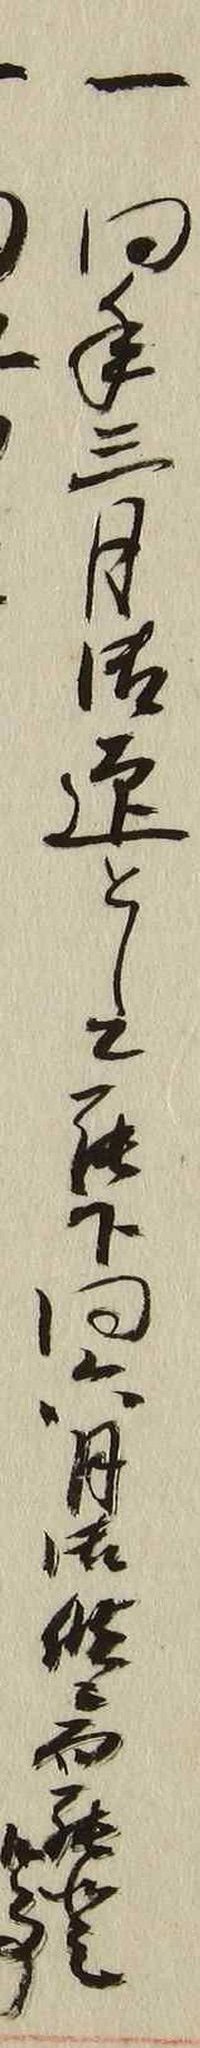一同年三月御迎として罷下同六月御供ニ而罷登候事
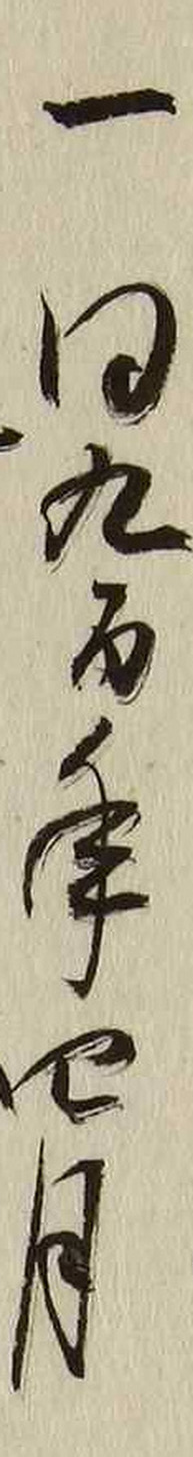一同九酉年四月
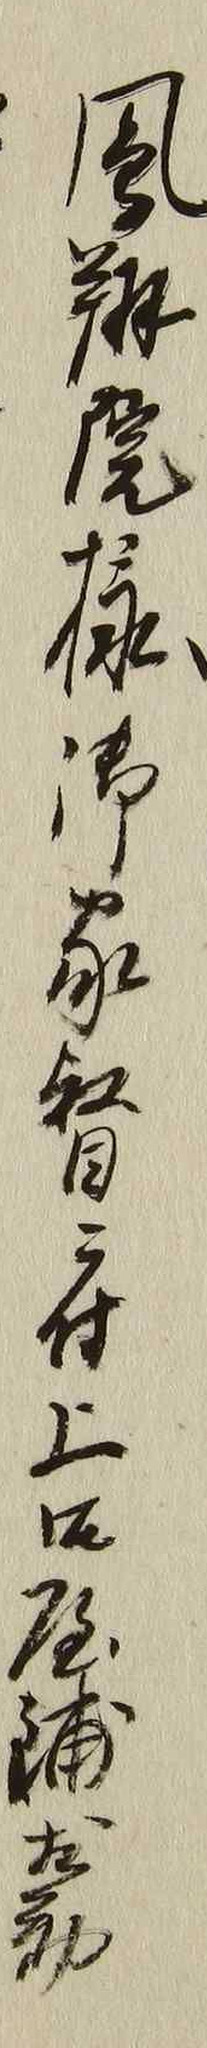鳳翔院様御家督ニ付上御屋鋪相勤
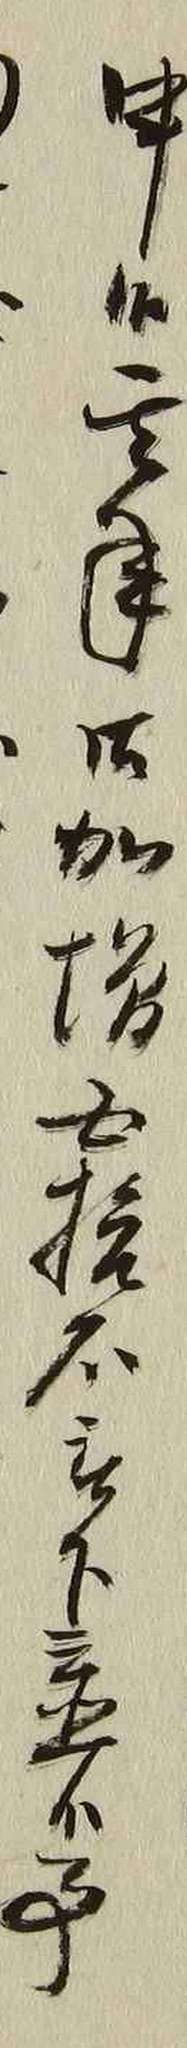申候其年御加増五拾石被下置候事
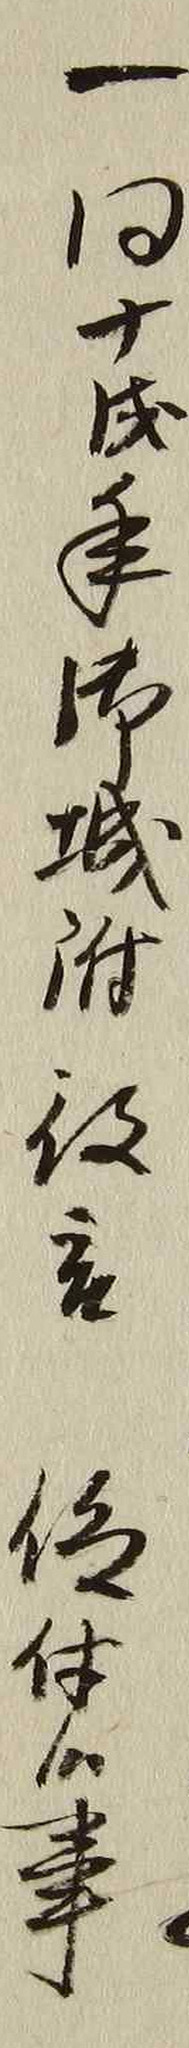一同十戌年御城附役被仰付候事
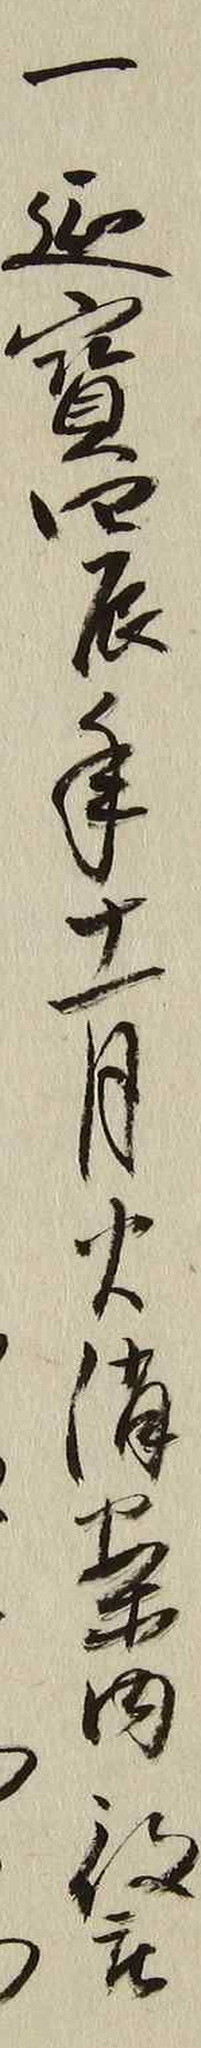一延宝四辰年十一月火消案内役被
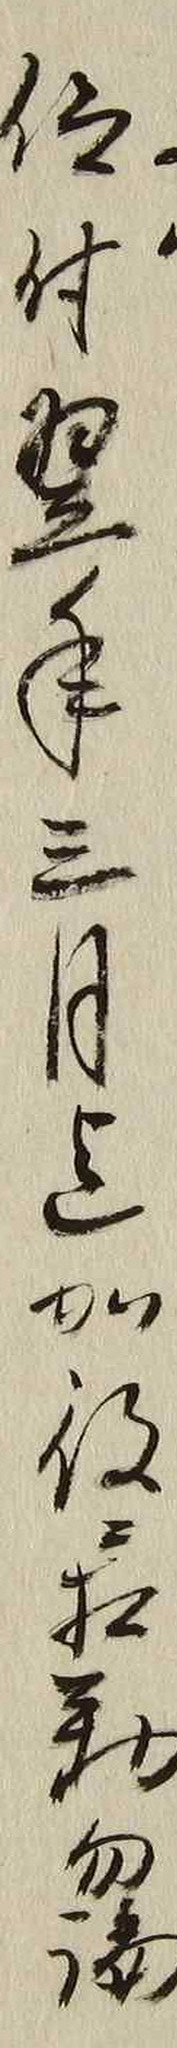仰付翌年三月迄加役ニ相勤勿論
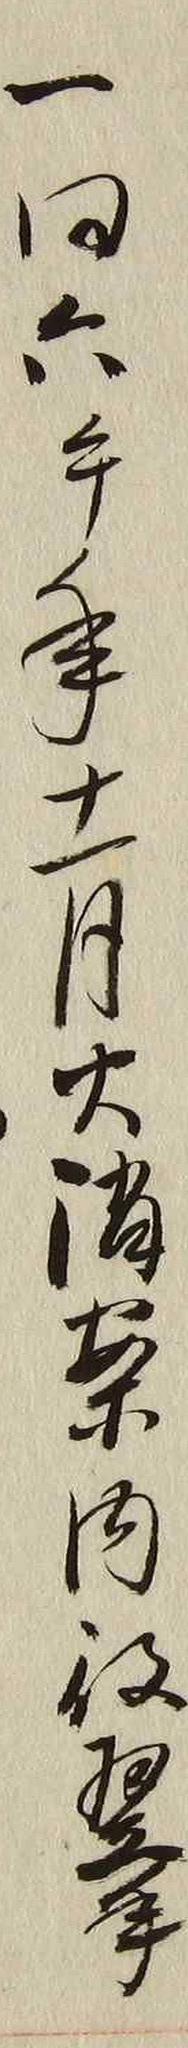一同六午年十一月火消案内役翌年
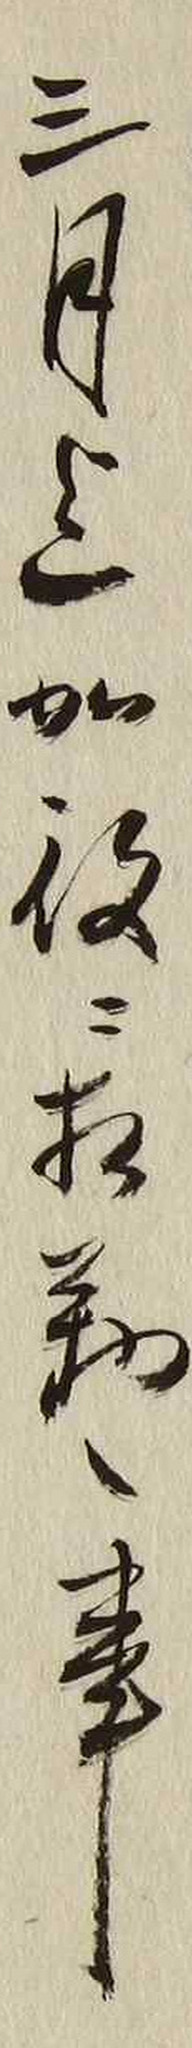三月迄加役ニ相勤候事
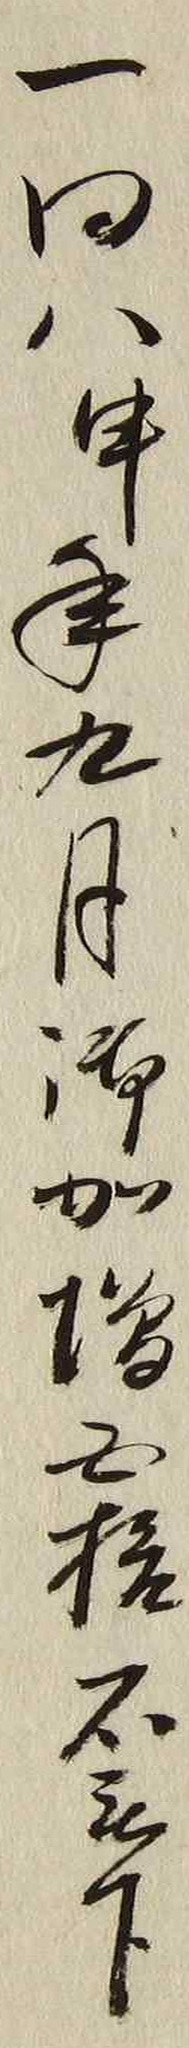一同八申年九月御加増五拾石被下
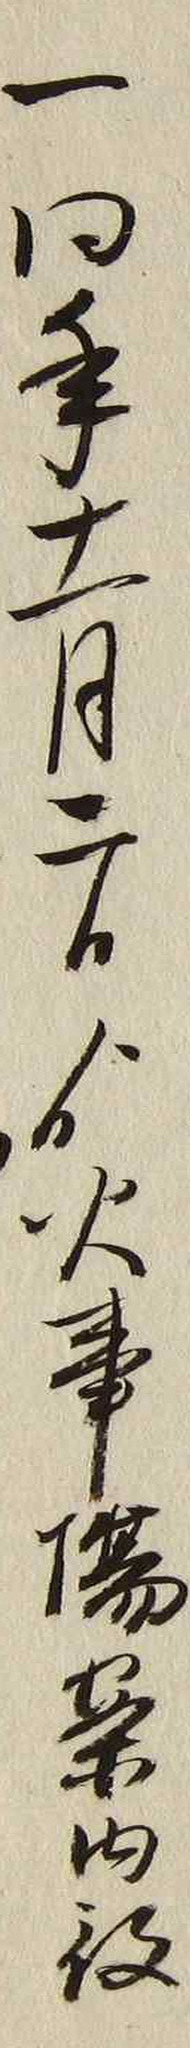一同年十一月二日ゟ火事場案内役
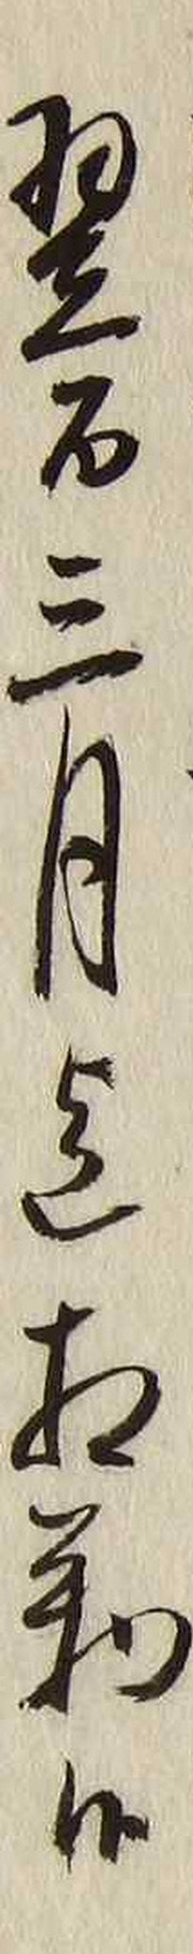翌酉三月迄相勤候
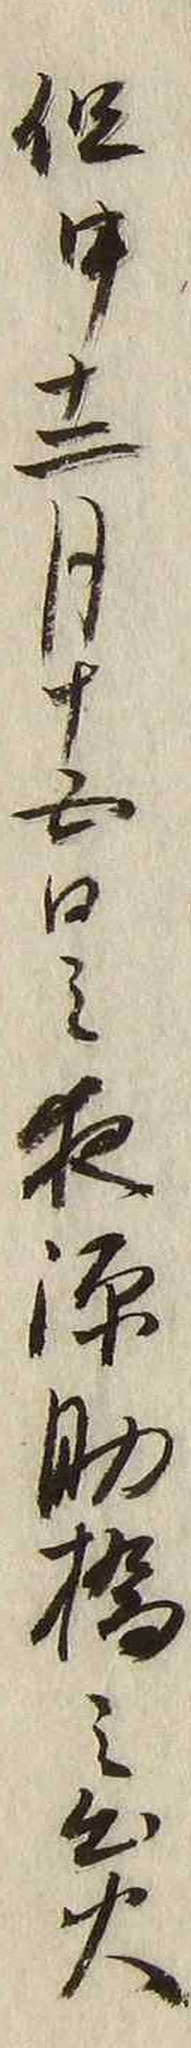但申十二月十五日之夜源助橋之出火
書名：諸士系譜　巻之349　も之部5
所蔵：会津若松市立会津図書館
